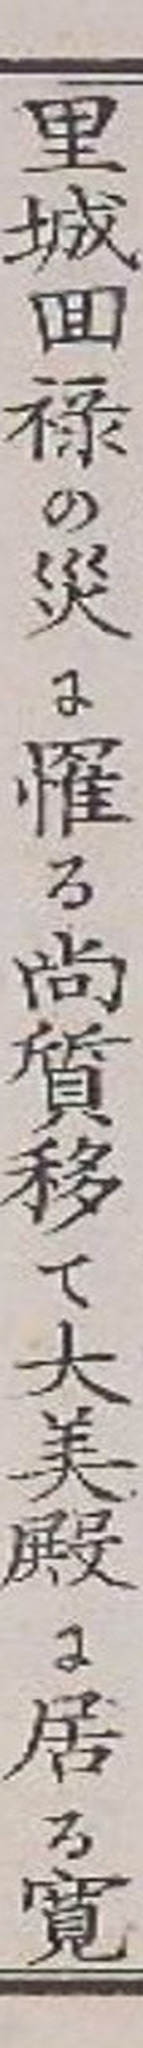里城四禄の災に罹る尚質移て大美殿に居る寛
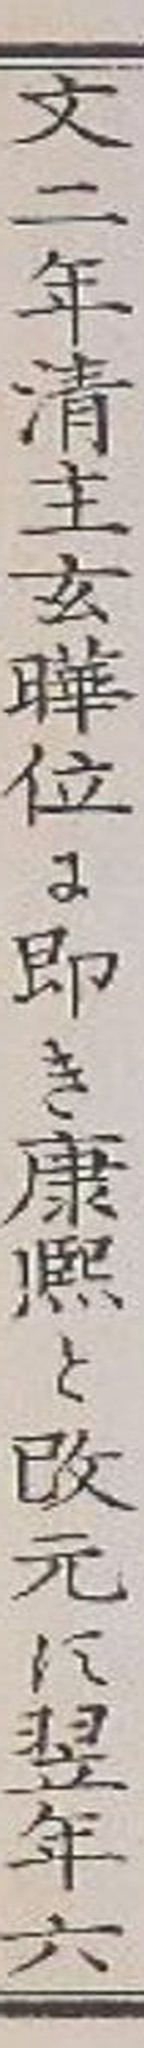文二年清主玄曄位に即き康煕と改元す翌年六
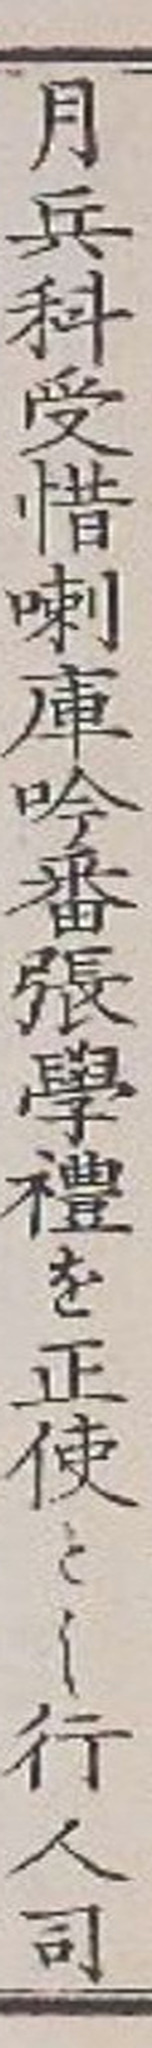月兵科受惜喇庫吟番張学礼を正使とし行人司
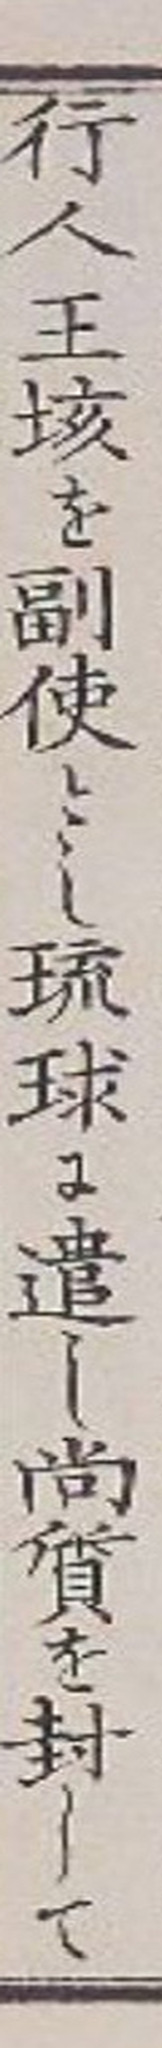行人王垓を副使とし琉球に遣し尚質を封して
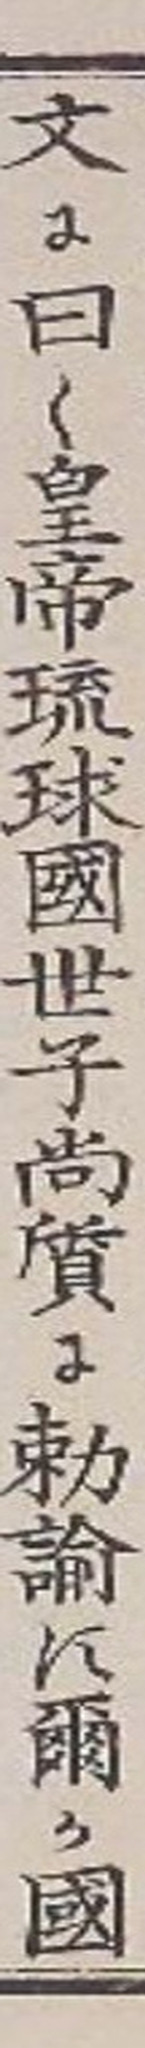文に曰く皇帝琉球国世子尚質に勅諭に爾か国
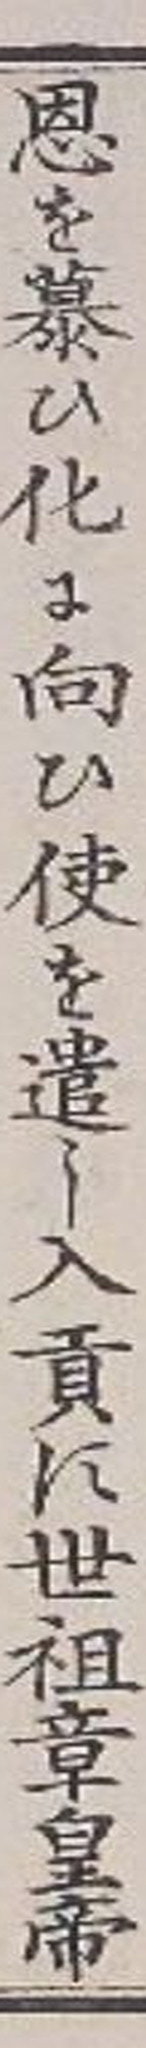恩を慕ひ化に向ひ使を遣し入貢す世祖章皇帝
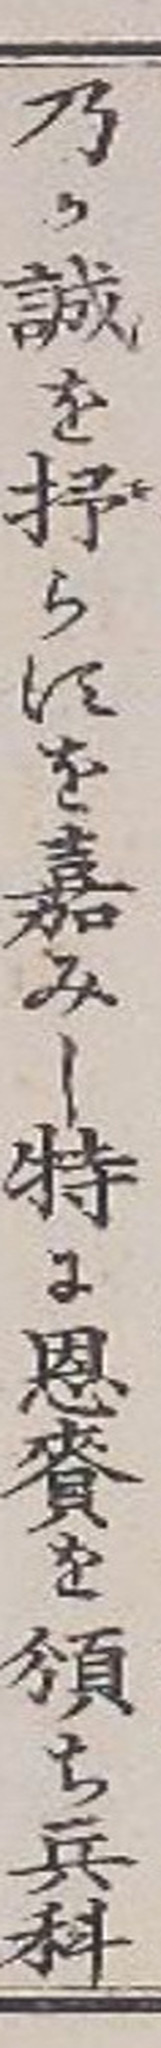乃か誠を抒らすを嘉みし特に恩賚を頒ち兵科
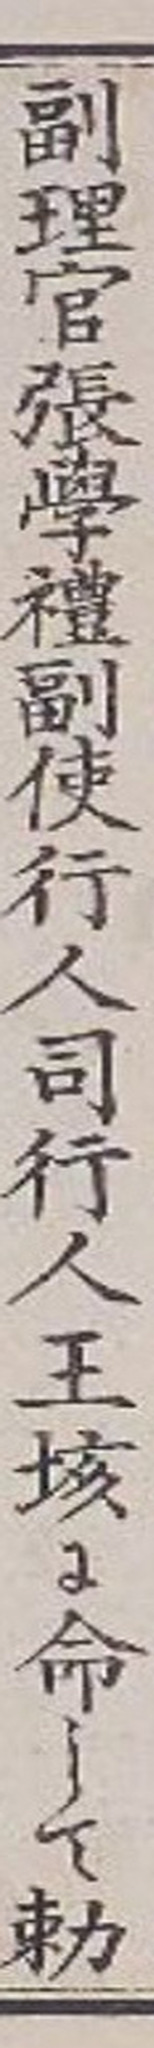副理官張学礼副使行人司行人王垓に命して勅
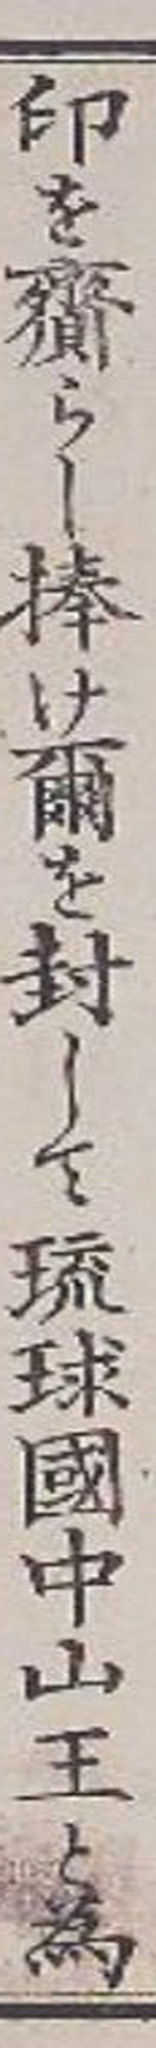印を齎らし捧け爾を封して琉球国中山王と為
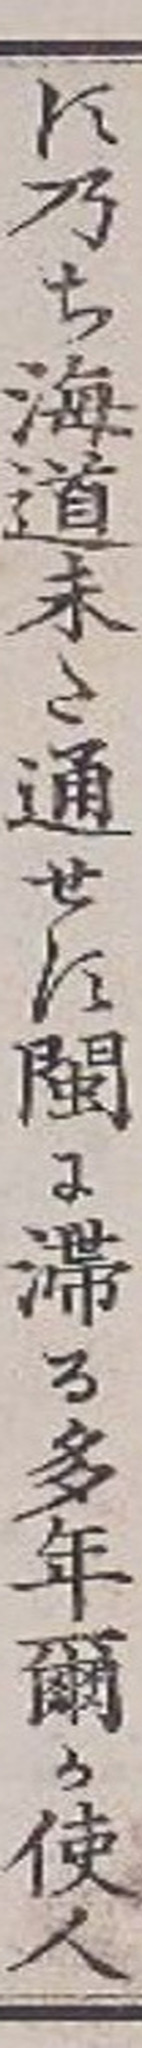す乃ち海道未た通せす閩に滞る多年爾か使人
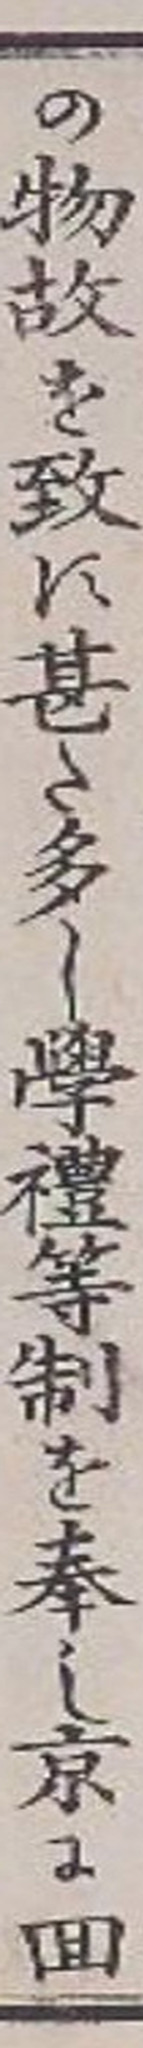の物故を致す甚た多し学礼等制を奉し京に回
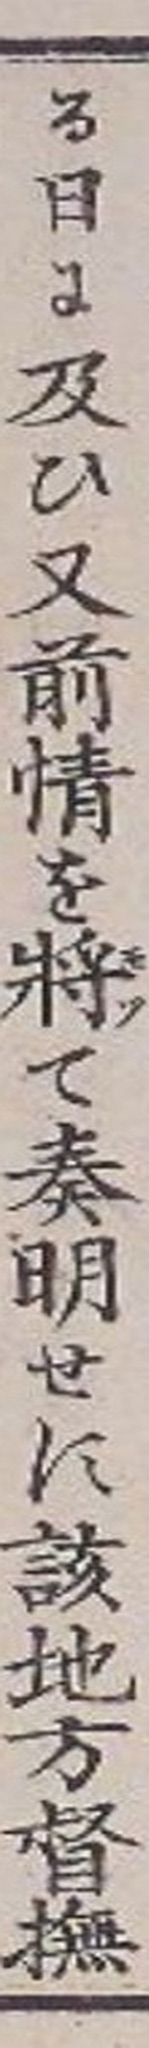る日に及ひ又前情を将て奏明せす該地方督撫

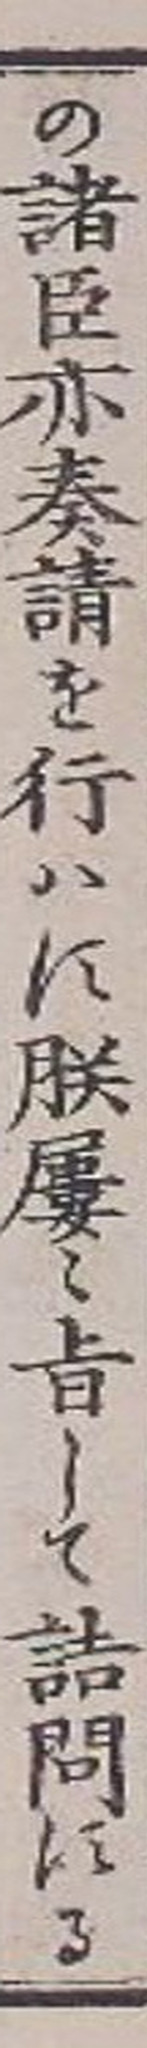の諸臣亦奏請を行はす朕屢々旨して詰問する
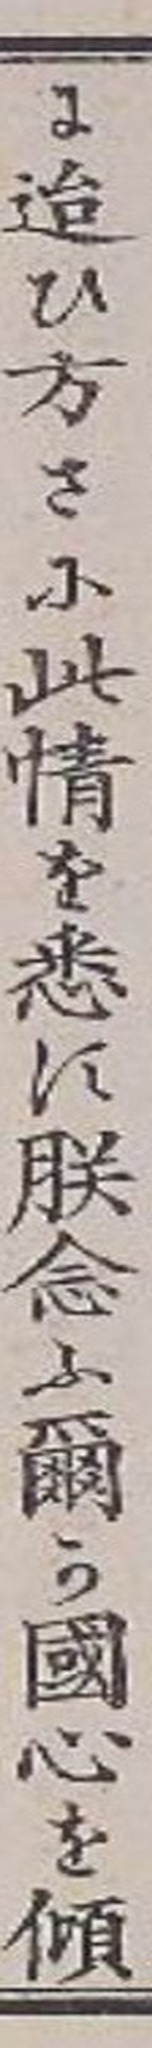に迨ひ方さに此情を悉す朕念ふ爾か国心を傾
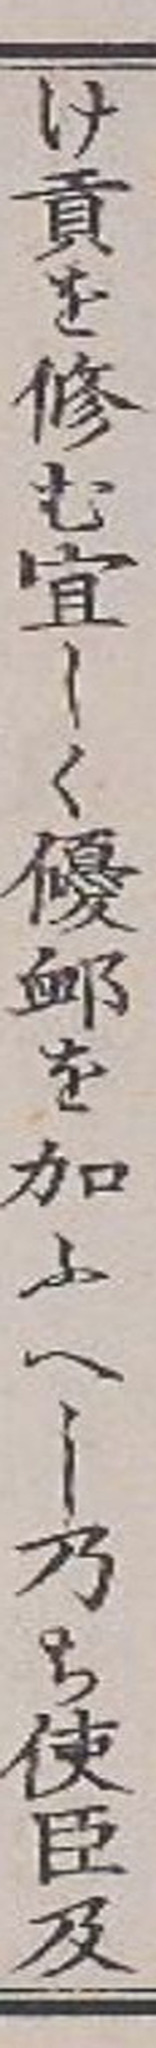け貢を修む宜しく優䘏を加ふへし乃ち使臣及
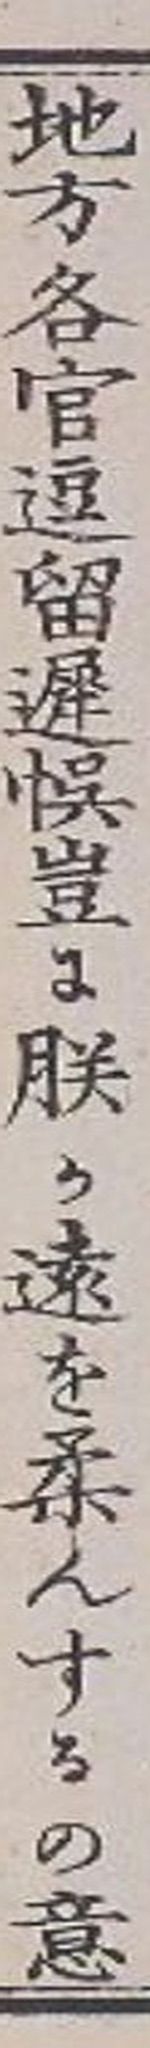地方各官逗留遅悞豈に朕か遠を柔んするの意
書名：南島紀事 下
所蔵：University of the Ryukyus Library
